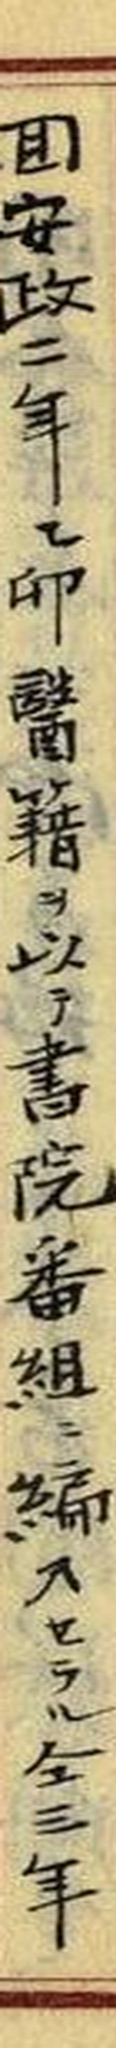回安政二年乙卯医籍ヲ以テ書院番組ニ編入セラㇽ同三年
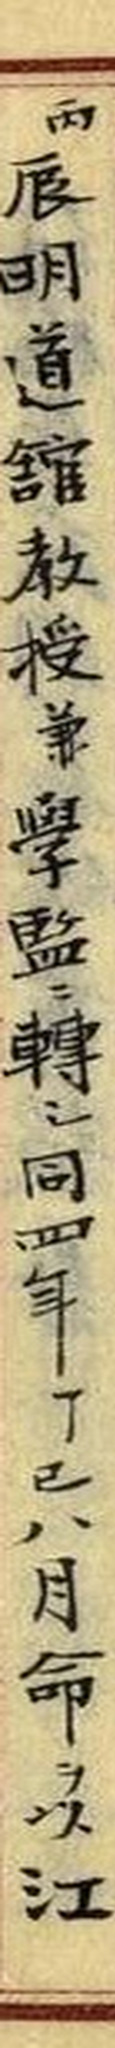丙辰明道館教授兼学監ニ転シ同四年丁巳八月命ヲ以江
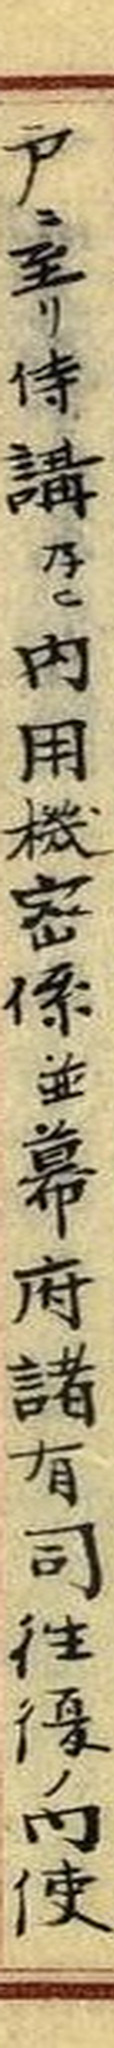戸ニ至リ侍講及ヒ内用機密係並幕府諸有司往復ノ内使
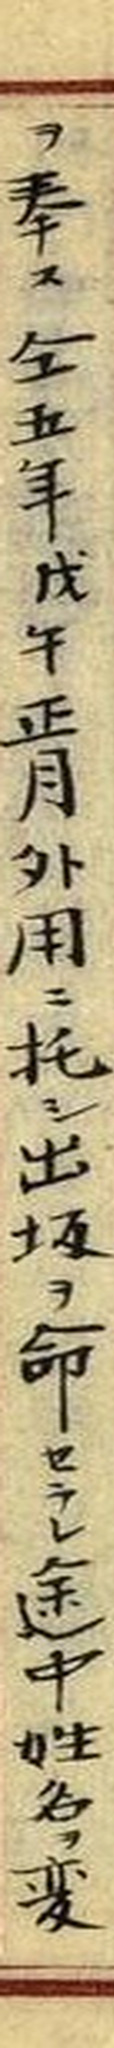ヲ奉ス同五年戌午正月外用ニ托シ出坂ヲ命セラレ途中姓名ヲ変
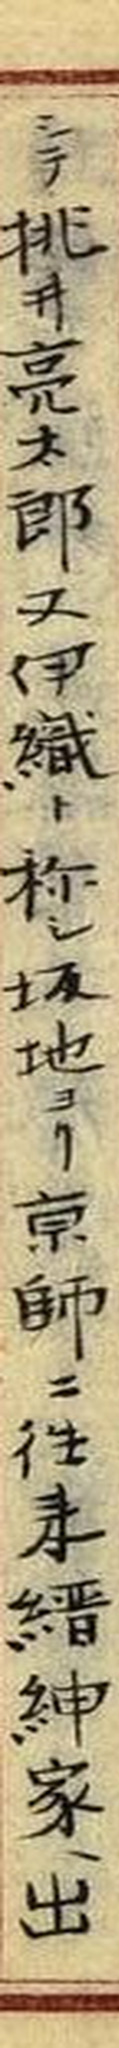シテ桃井亮太郎又伊織ト称シ坂地ヨリ京師ニ往来縉紳家へ出
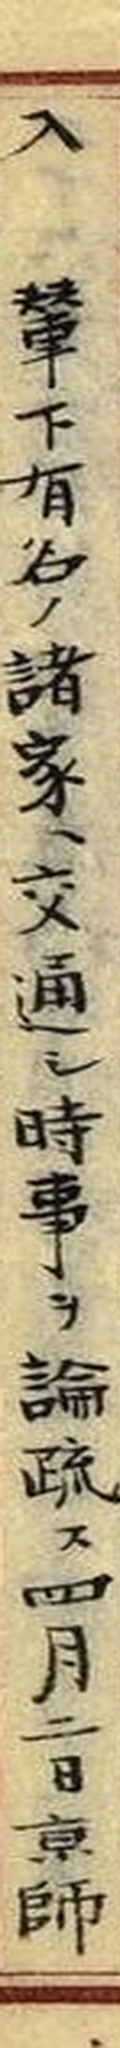入輦下有名ノ諸家へ交通シ時事ヲ論疏ス四月二日京師
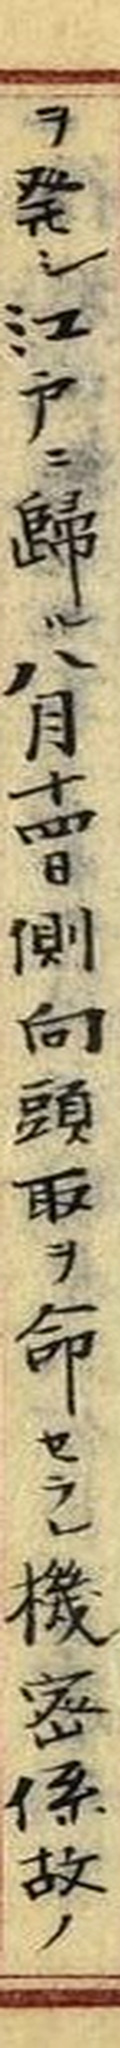ヲ発シ江戸ニ帰ㇽ八月十四日側向頭取ヲ命セラレ機密係故ノ
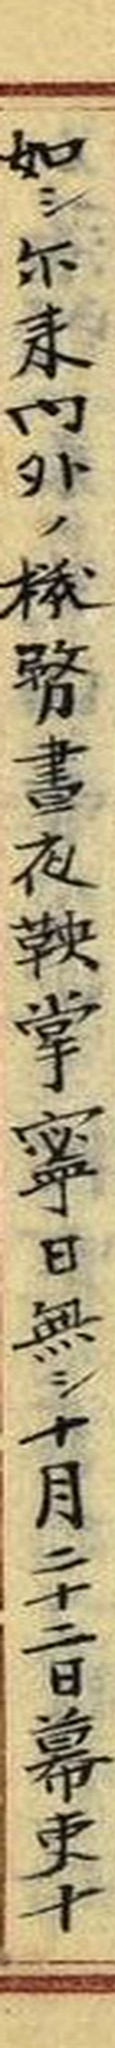如シ爾来内外ノ機務晝夜鞅掌寧日無シ十月二十二日幕吏十

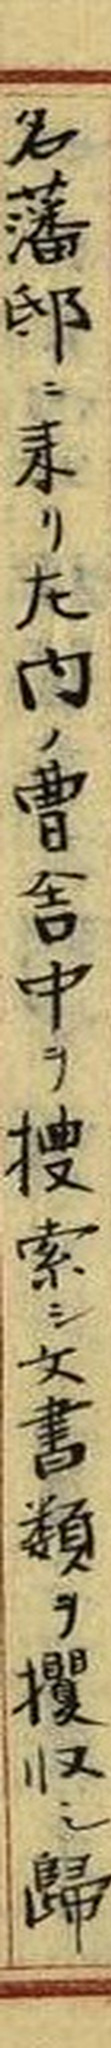名藩邸ニ来り左内ノ曹舎中ヲ捜索シ文書類ヲ攫収シ帰
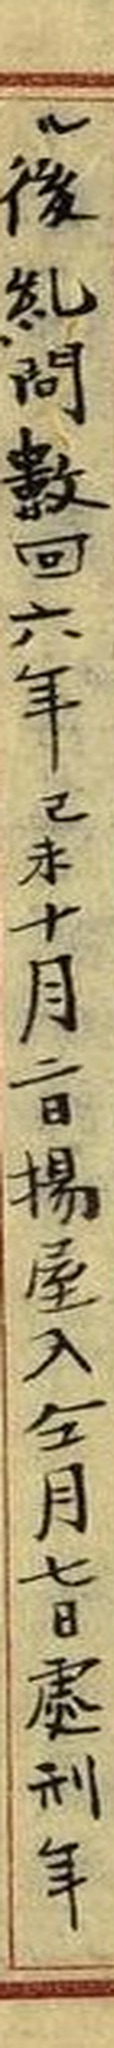ㇽ後糺問数回六年己未十月二日揚屋入同七日処刑年
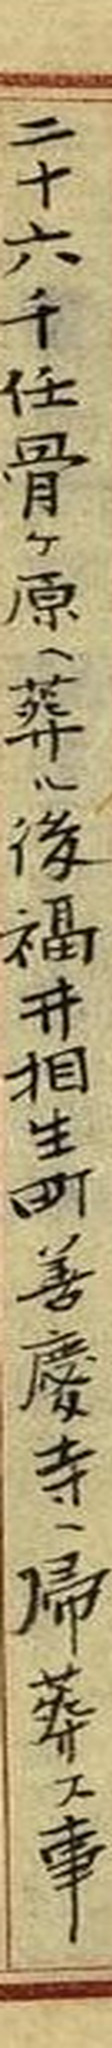二十六千住骨ヶ原へ葬ㇽ後福井相生町善慶寺へ帰葬ス事
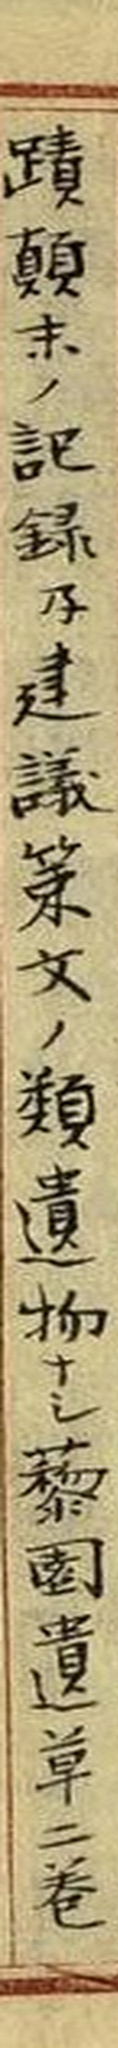蹟顛末ノ記録及建議策文ノ類遺物ナシ藜園遺草二巻
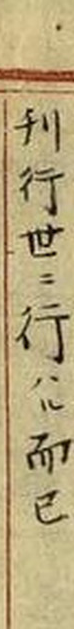刊行世ニ行ハㇽ而巳
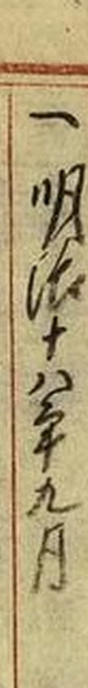一明治十八年九月
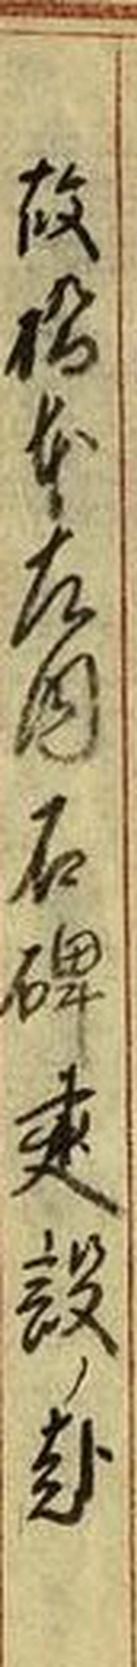故橋本左内石碑建設ノ赴
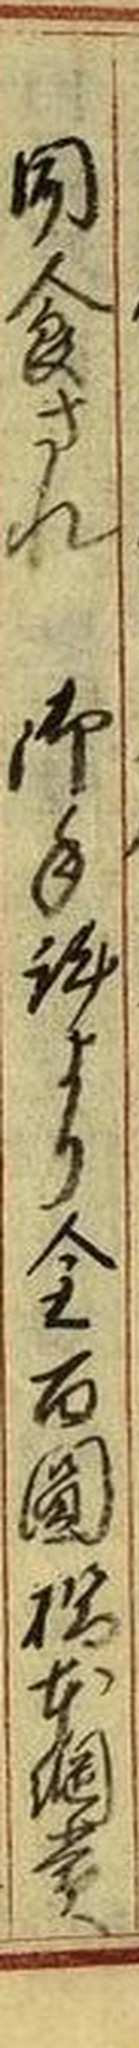聞食され御手許より金百円橋本綱常へ
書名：温古集 三巻
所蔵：福井県文書館 Fukui Prefectural Archives
